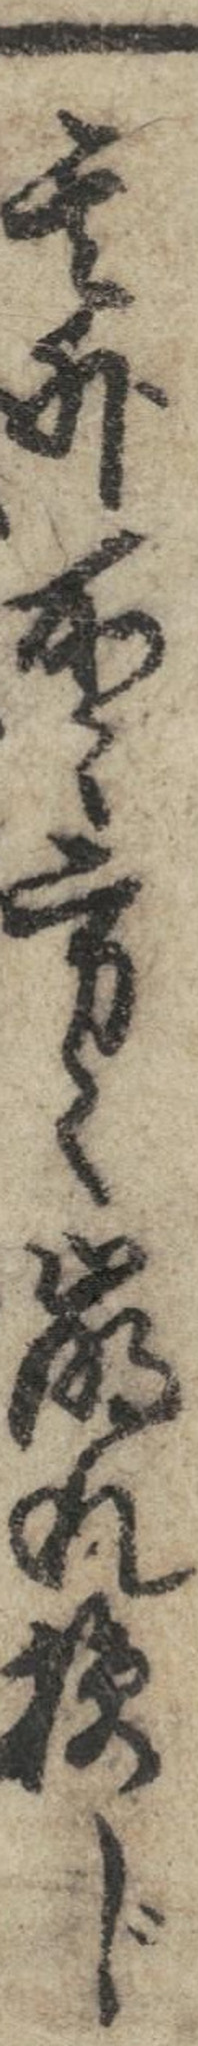其外所〻方〻崩れ損じ
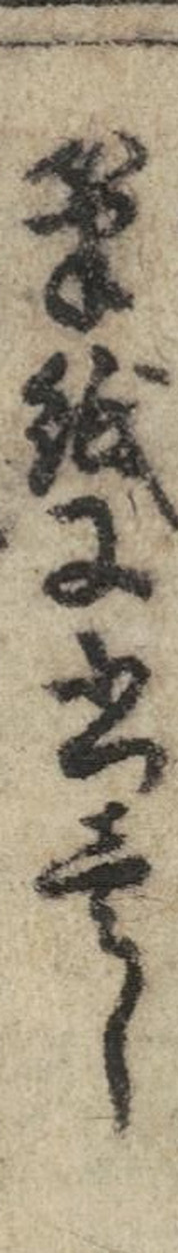筆紙に書尽し
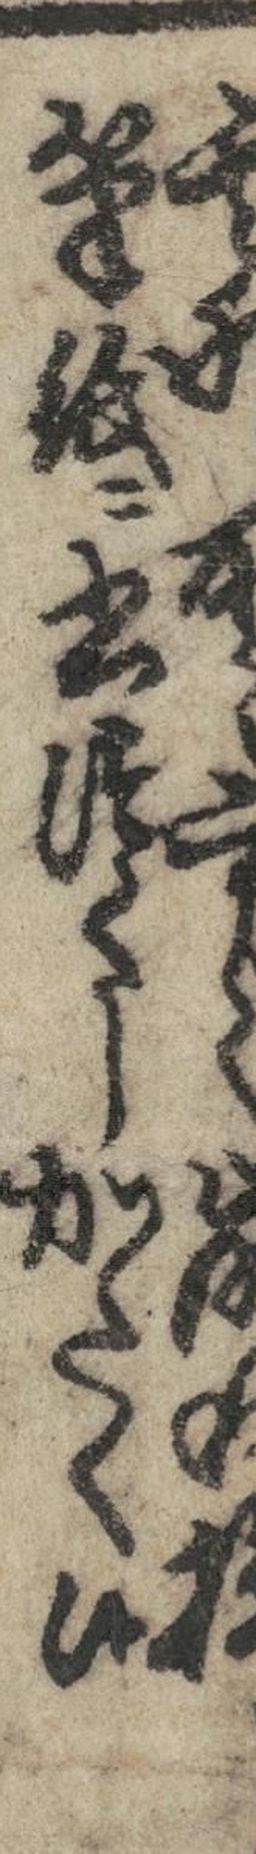筆紙ニ書つくしかたく候
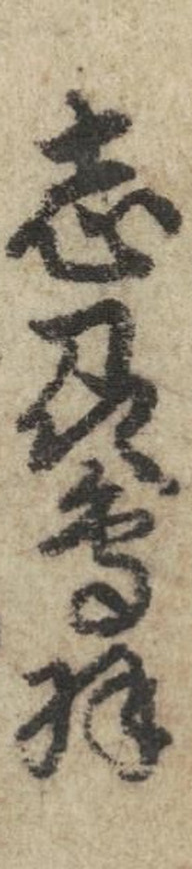志州鳥羽
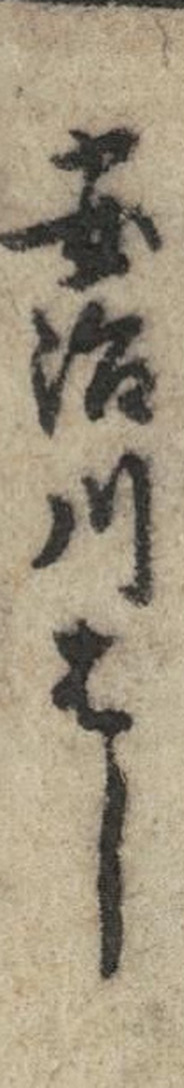安治川はし
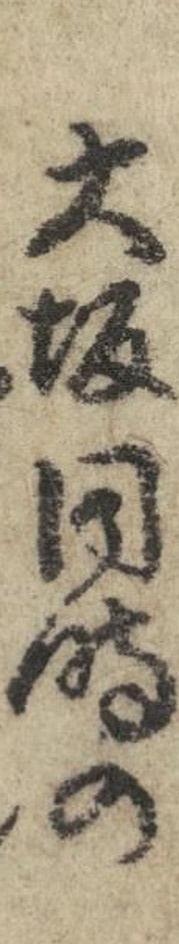大坂同時の
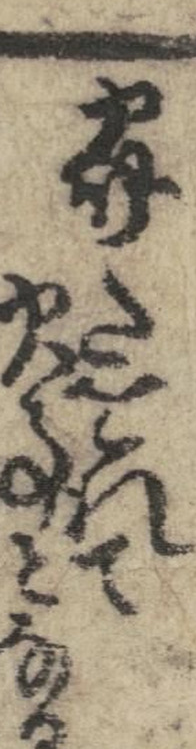家たおれて
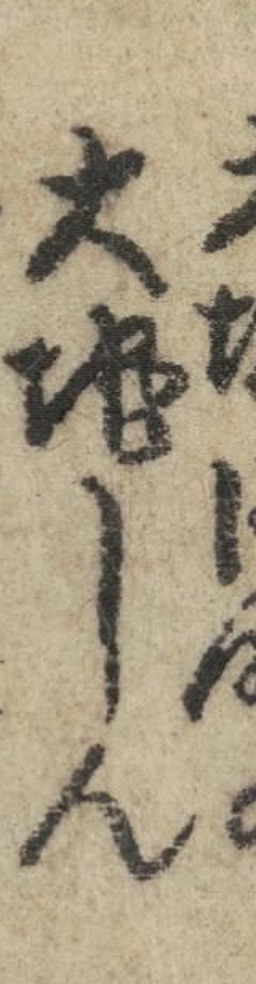大地しん
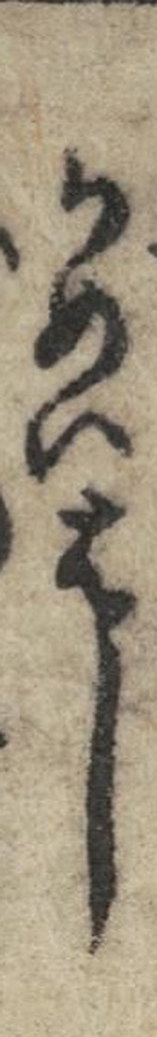かめいはし
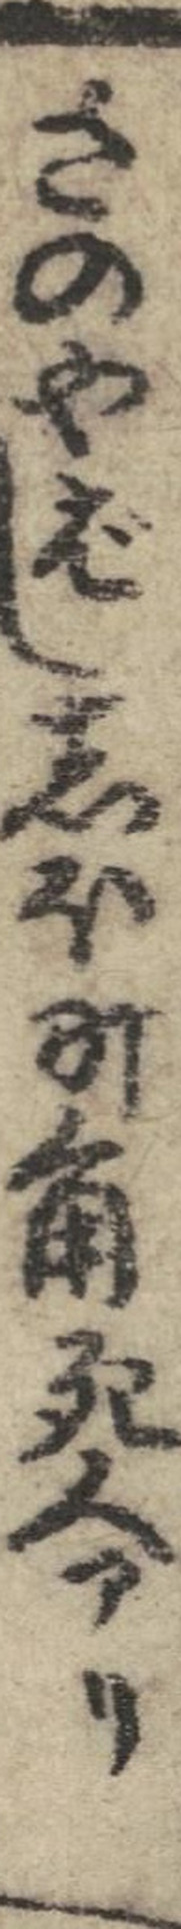さのやばししほみ角死人アリ
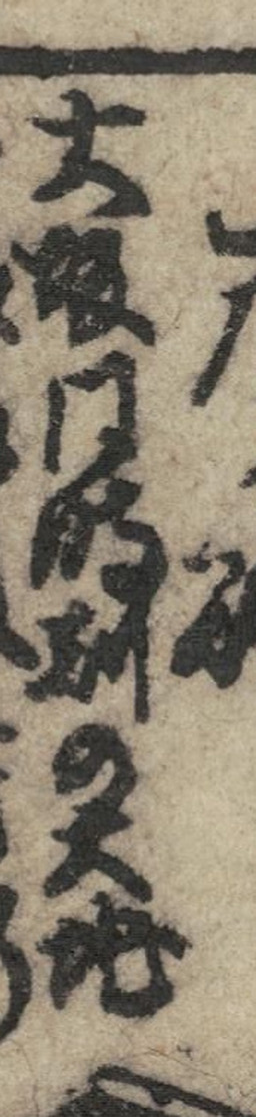大坂同時刻の大地
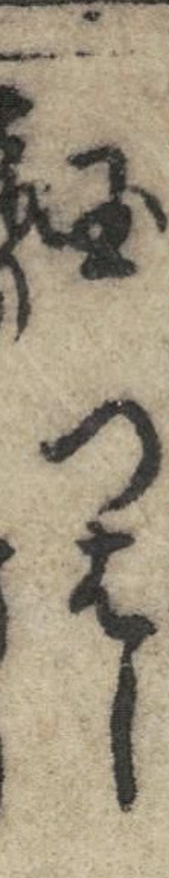国つはし
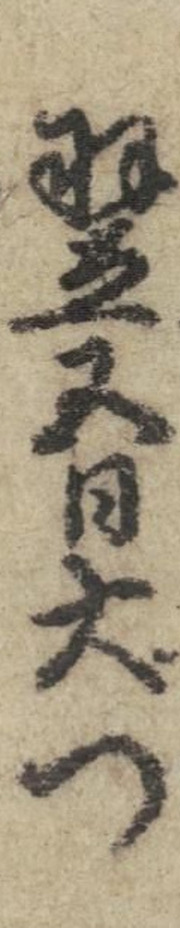翌五日大つ
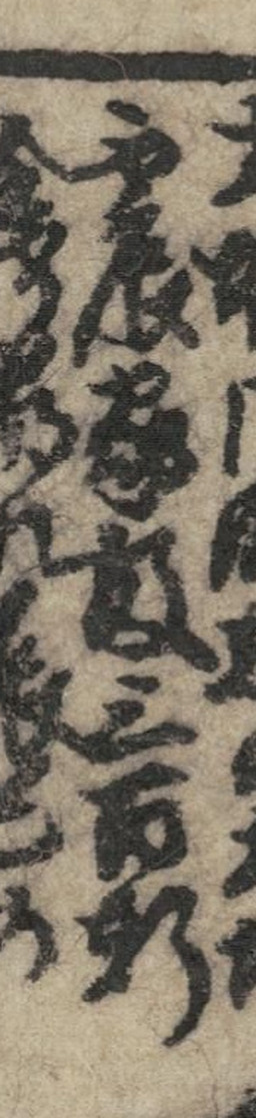震家数三百軒
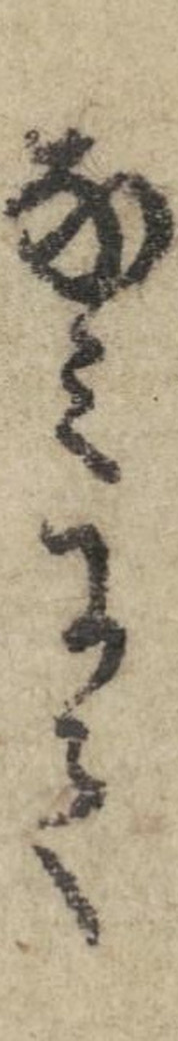なみにて
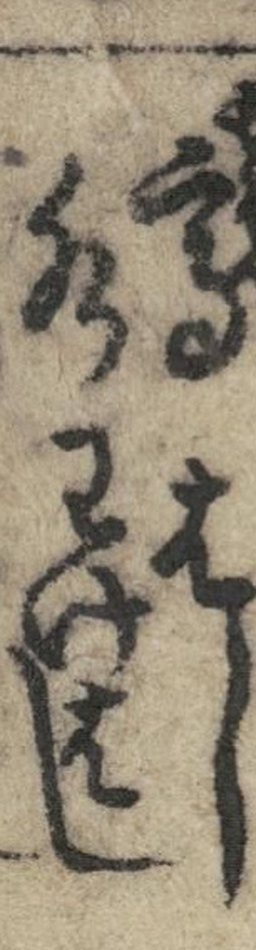水わけはし
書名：諸国大阪太地震大つなミ末代噺
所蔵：東京大学地震研究所図書室 Earthquake Research Institute Library, The University of Tokyo, JAPAN
